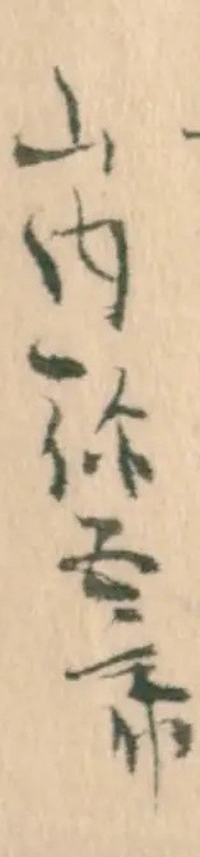山内弥五郎
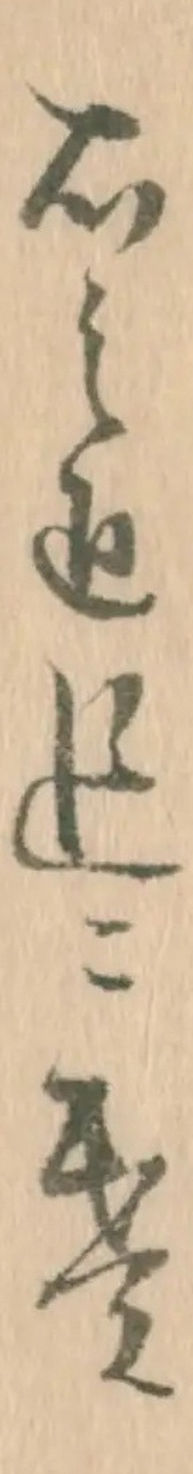右之通追々遣ス
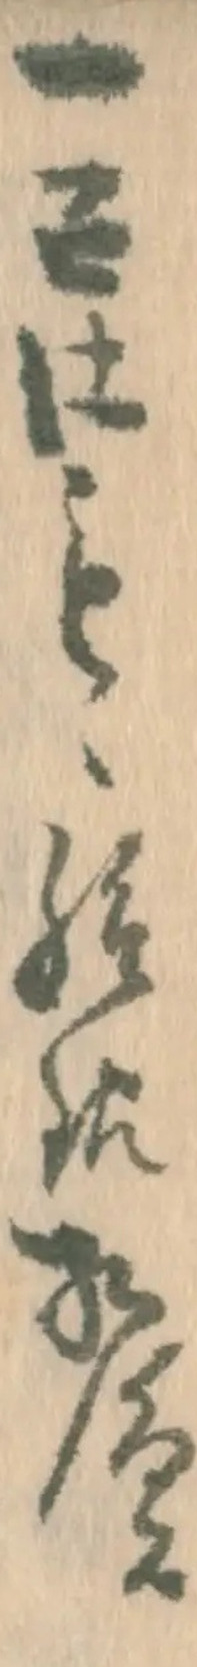一召仕ともへ給銀相渡ス
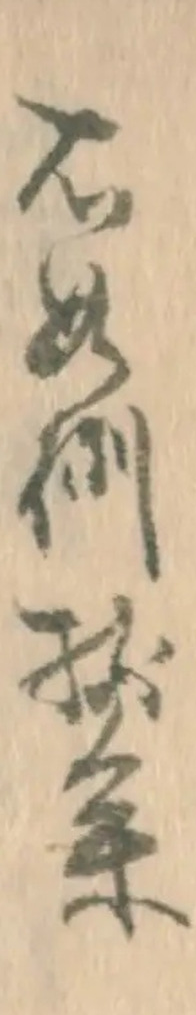右如例持参
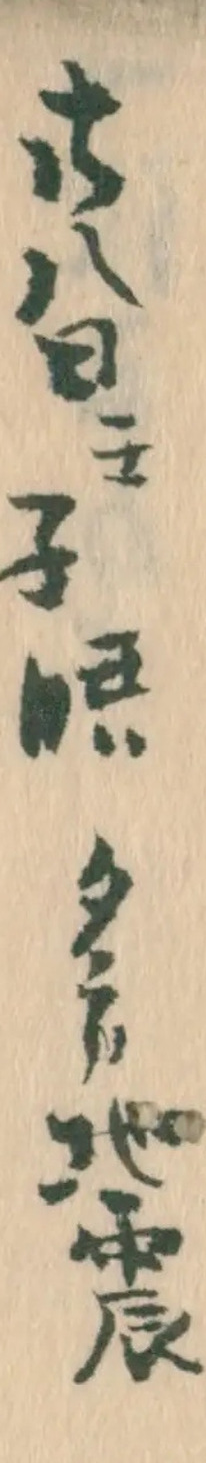廿八日壬子晴夕方地震
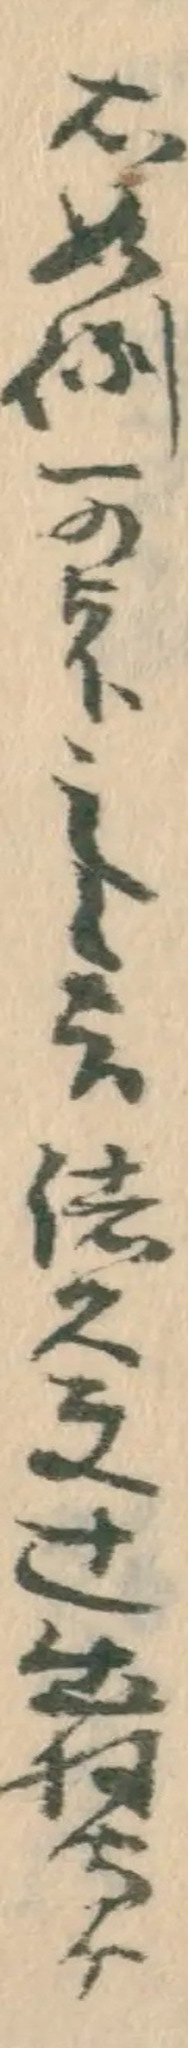右如例可被下之旨諸大夫辻出羽守ゟ
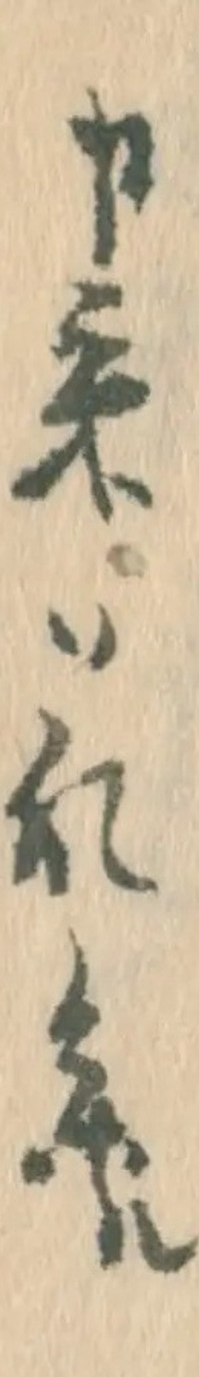申参御礼参ル
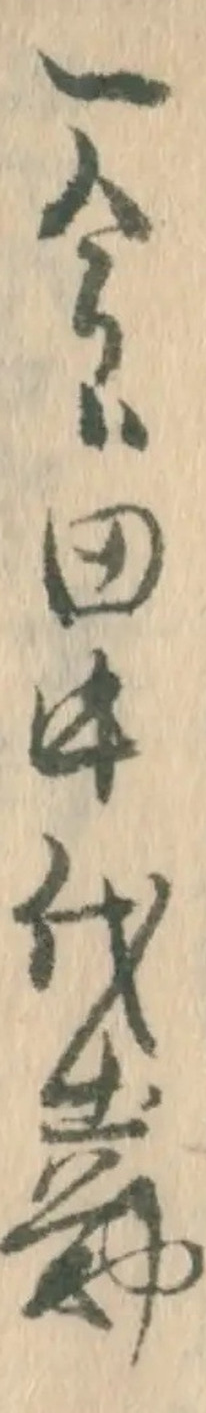一今日田中代出勤

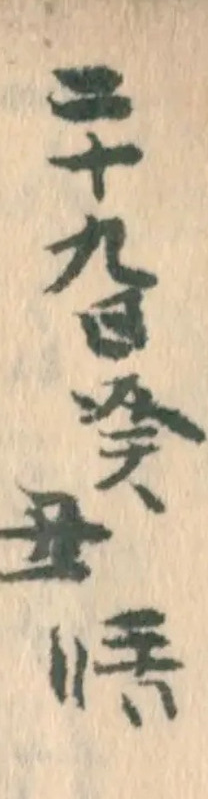二十九日癸丑晴
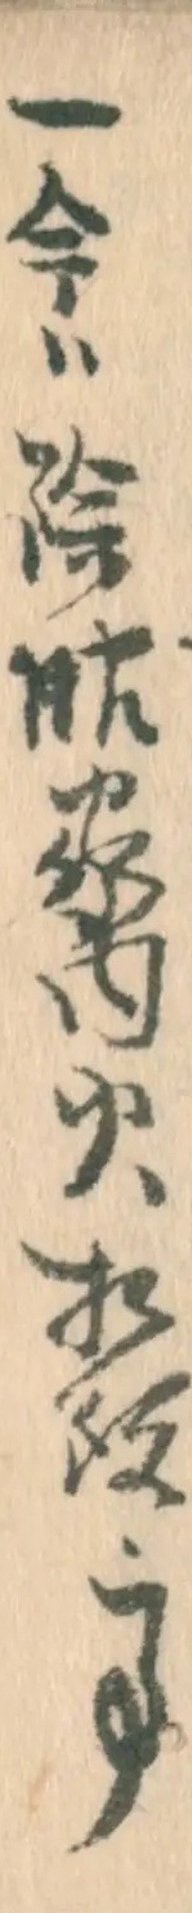一今日除服家内火相改候事
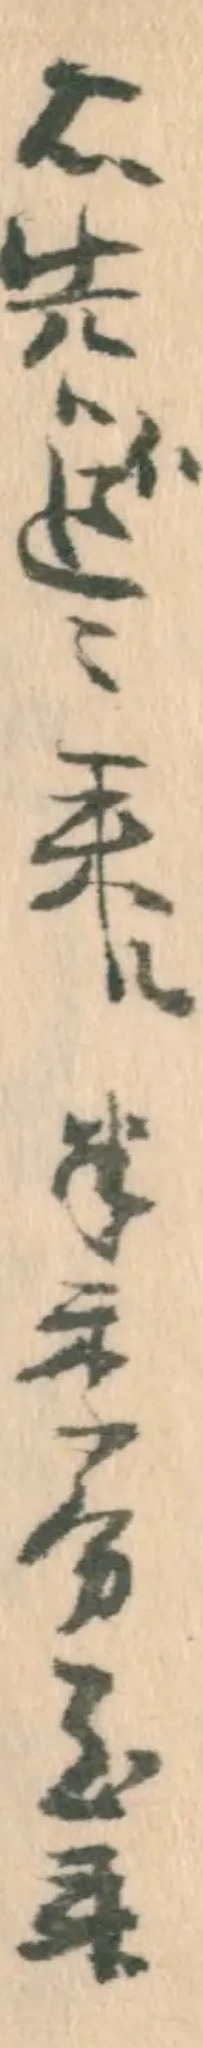右先日ゟ追々来ル半季分到来
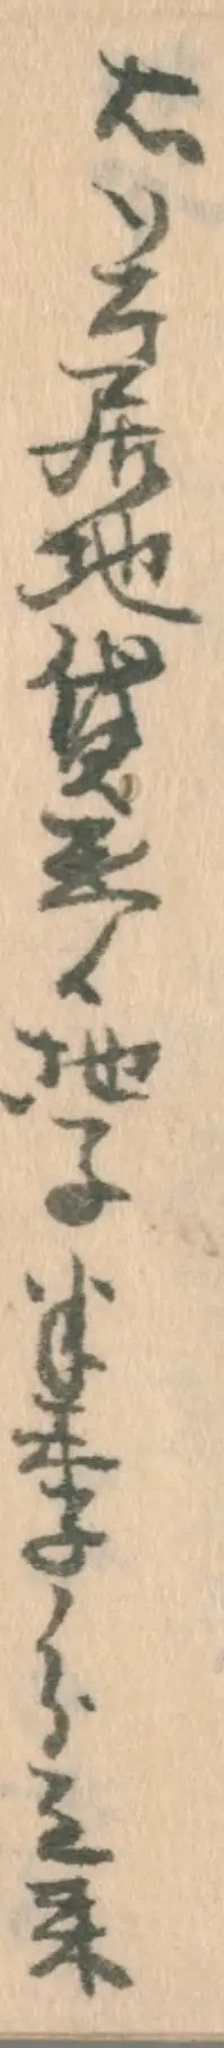右御土居地貸遣候地子半季分到来
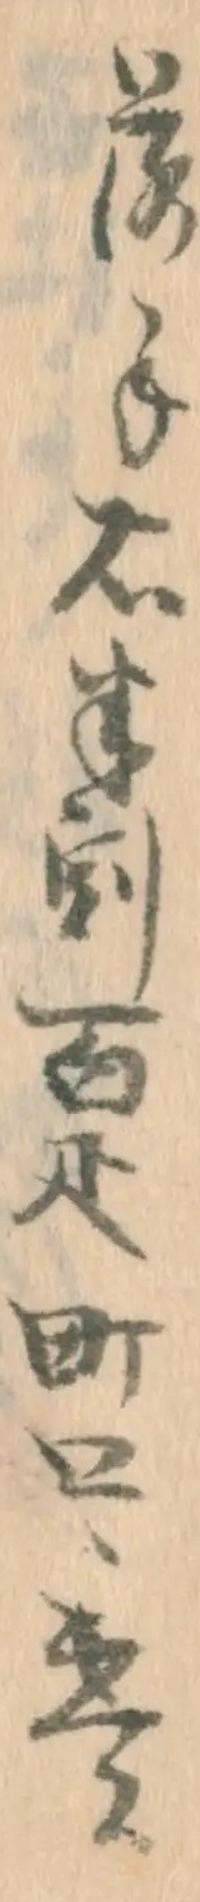落手右半割百疋町口へ遣ス
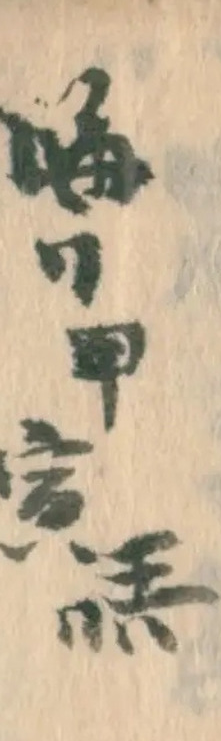晦日甲寅晴
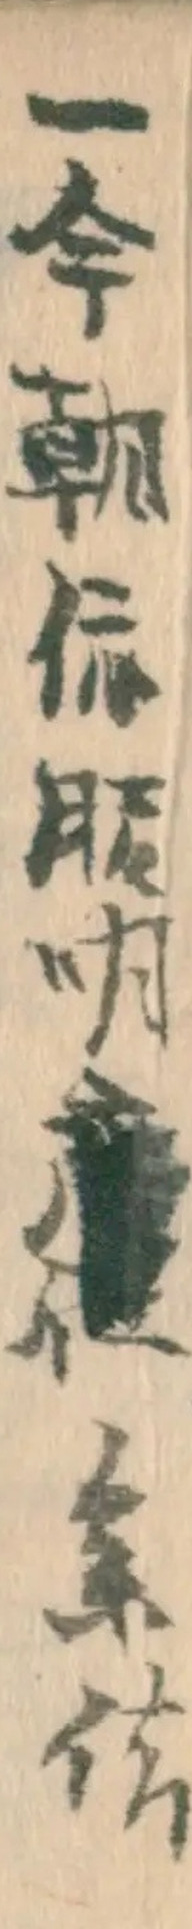一今朝依服明御霊え参詣
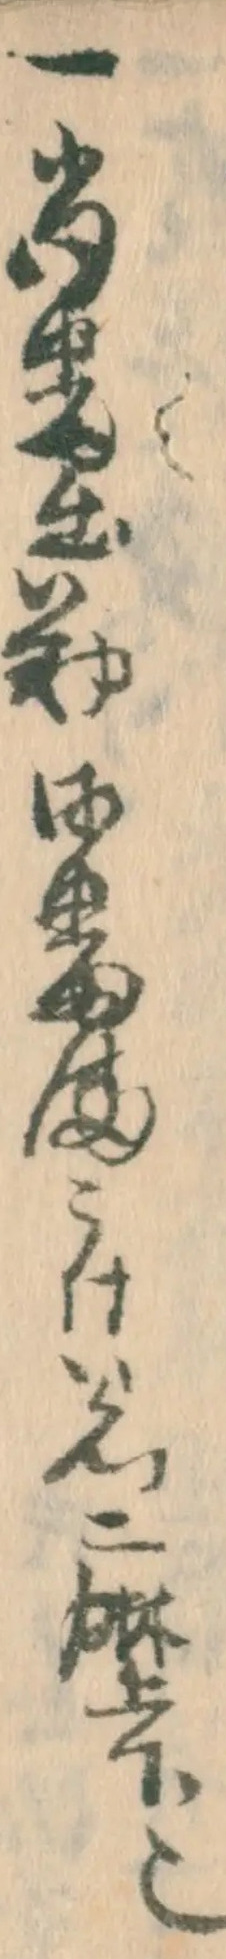一当番出勤御番備ニ付着麻上下也
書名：禁裏御所御用日記. [131]
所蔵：国立国会図書館 National Diet Library, JAPAN
